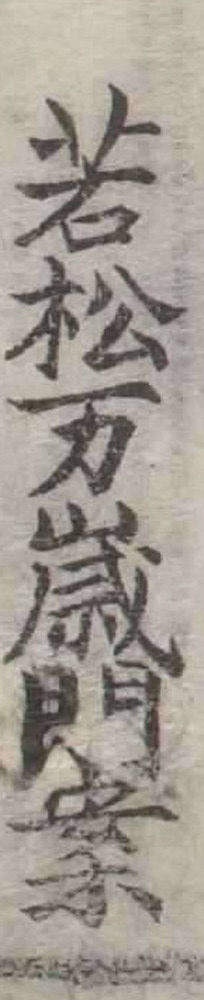若松万歳門案

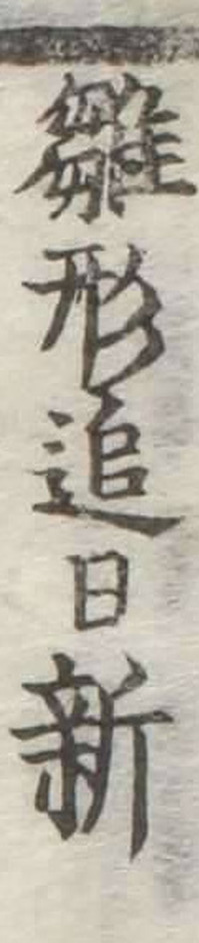雛形追日新
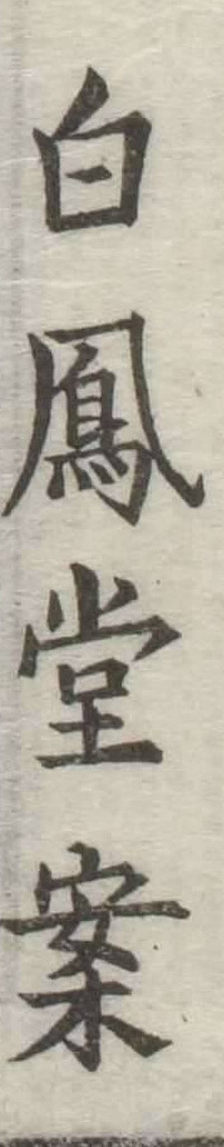白鳳堂案
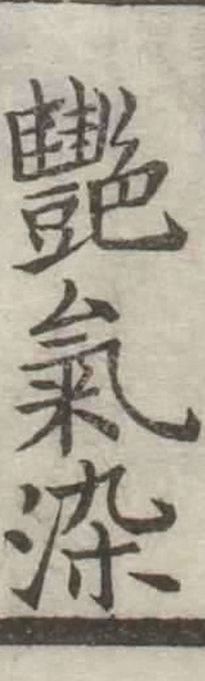艶気染
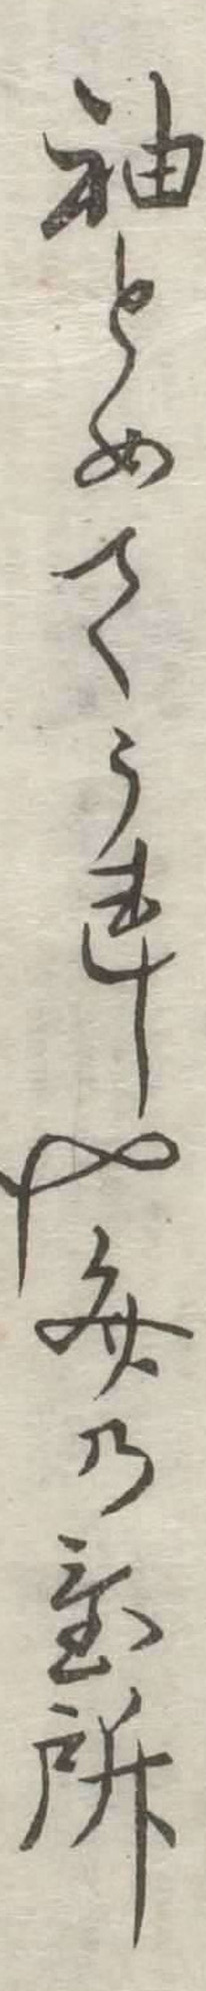袖とめてうれしや文の置所
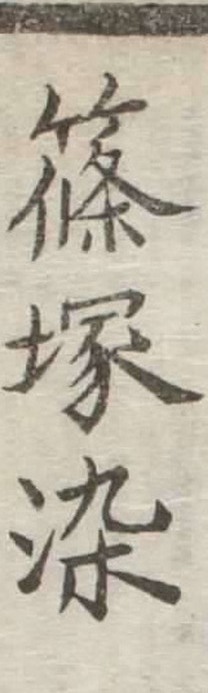篠塚染
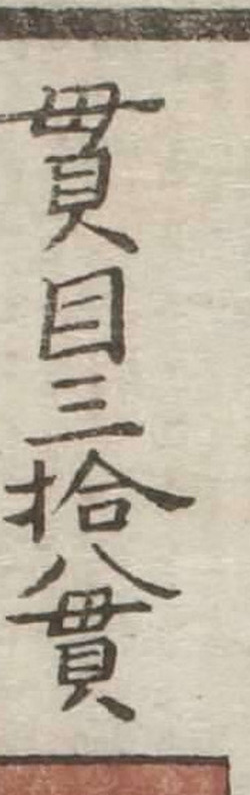貫目三拾八貫
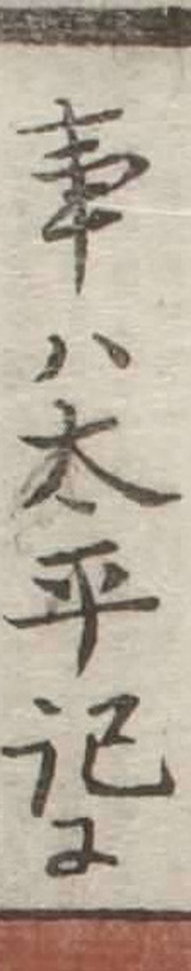事は太平記に
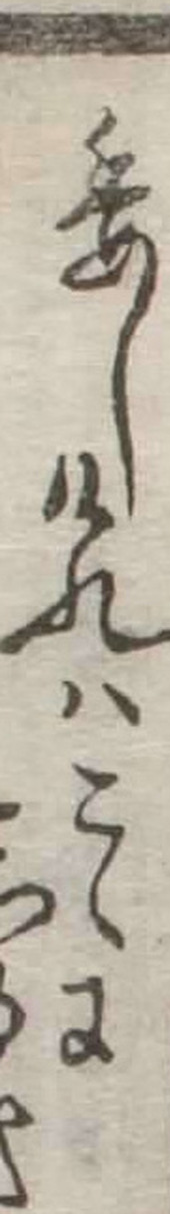委しけれはこゝに
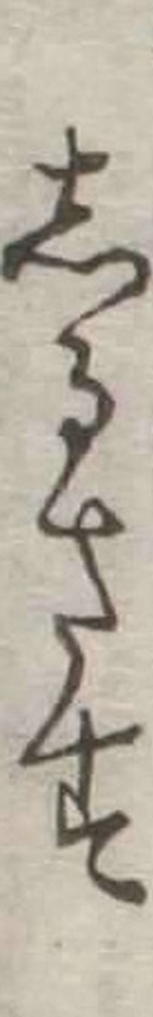しるさす

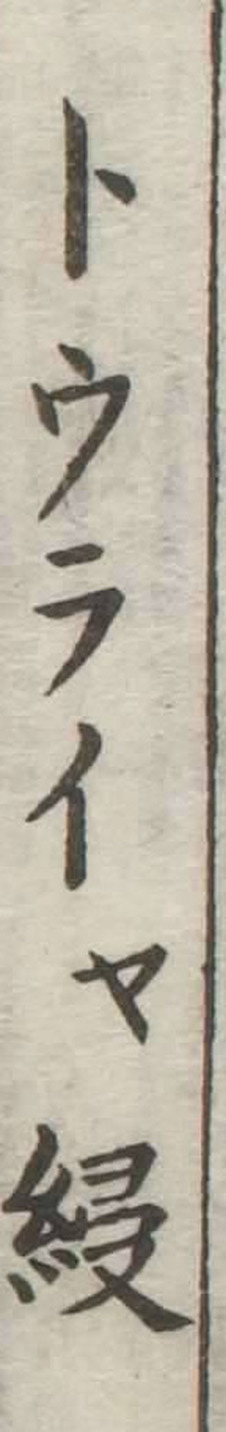トウライヤ綅
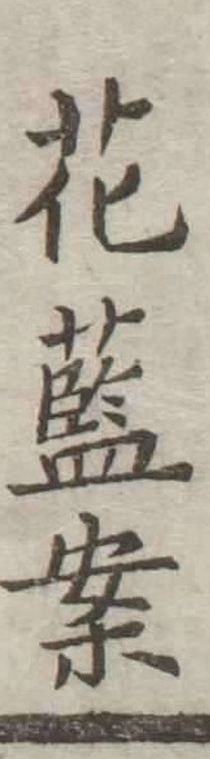花藍案
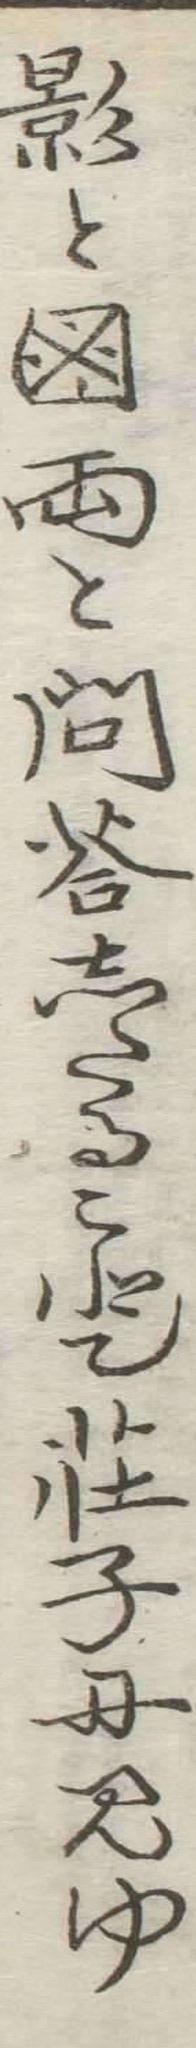影と罔両と問答したること荘子に見ゆ
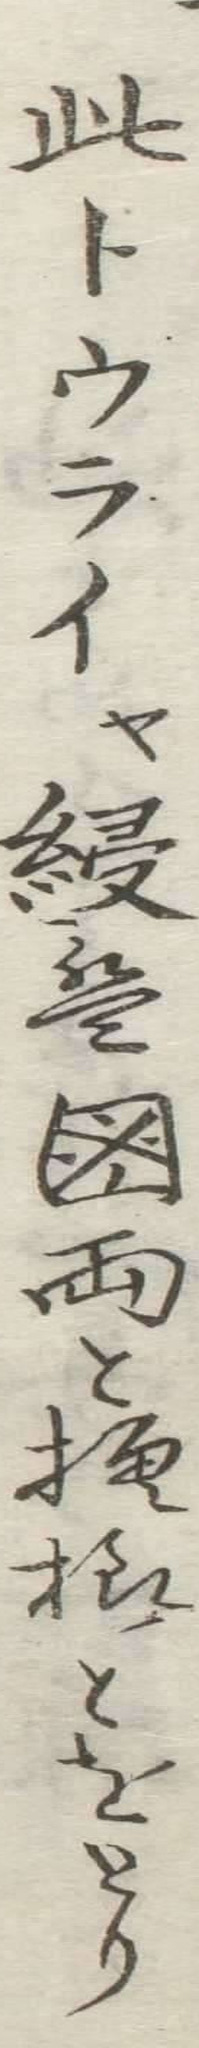此トウライヤ綅は罔両と模様とをとり
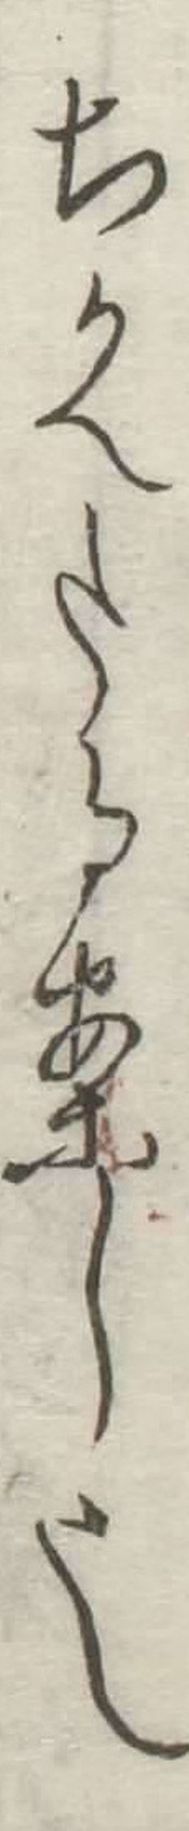ちかへたる案し也
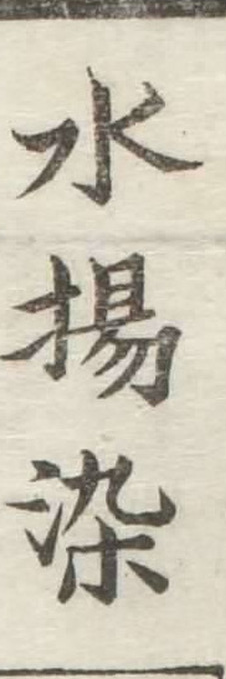水揚染
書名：たなくひあわせ
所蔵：国文学研究資料館
